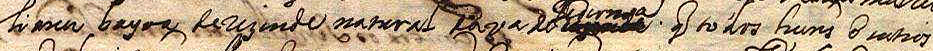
lianor bayoa de rezende natural da va de Pedernra q̄ todos huns̄ e outros
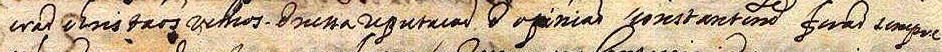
erão christaõs velhos e nessa reputaçaõ e opinião constantemte forão sempre
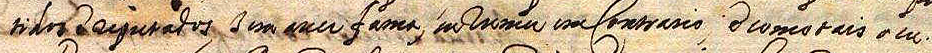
tidos e reputados sem auer fama, nēhuma em Contrario, e como tais ocu
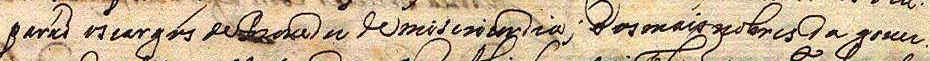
paraõ os cargos de Prouedor de misericordia; dos mais nobres da gouer
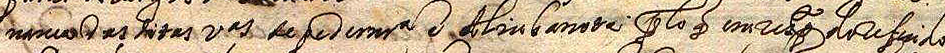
nança das ditas vas, de pedernra, e Aliubarrota p̄lo q̄ em respto do referido
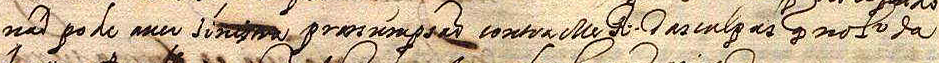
não pode auer sinistra presumpsaõ contra elle R. das culpas q̄ no lo da
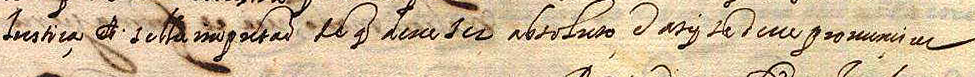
Iustiça A. se lhe imputaõ de q̄ deue ser absoluto, e asy se deue pronunciar
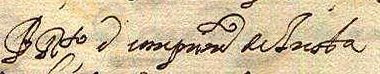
P Rto e comprimto de Iusta
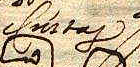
e Custas
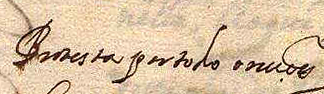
Protesta por todo o necesso
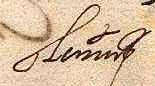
Lencast̄
